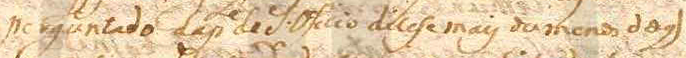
perguntado da p.te do s. officio dicese mais ou menos do q̄
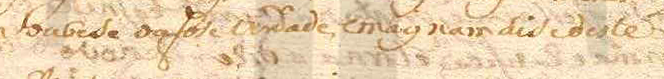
soubese ou fose verdade, e mais nam dise deste.
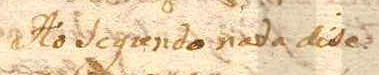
Ao segundo nada dise
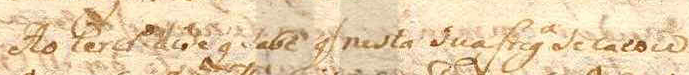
Ao tercr.o dise q̄ sabe q̄ nesta sua frega se cazou
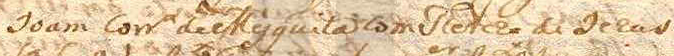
Ioam Corra de Misquita com Thereza de Iezus
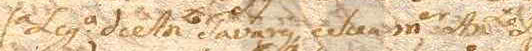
fa Leg.a de Anto Tavares, e sua m.er An.ta
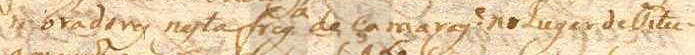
moradores nesta freg.a de Camaraes e no Lugar de Fitu
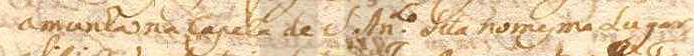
amunha na capela de S An.to sita no mesmo Lugar,
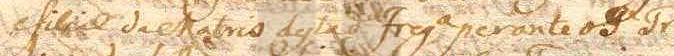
e filial da Matris desta d.a freg.a perante o S. Fr
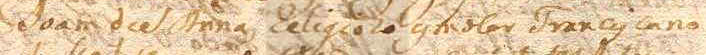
Ioam de S Anna, Religiozo esmolar Franciscano
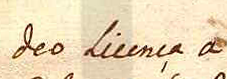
deo Licença a
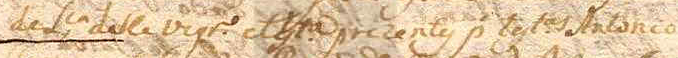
de L,ca delle vigr.o e testa prezentes pa test.as Antonio
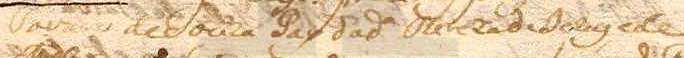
Tava_s de Souza Pay da d.a Thereza de Iezus, e de
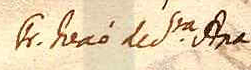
Fr. Ioaõ de S.ta Ana
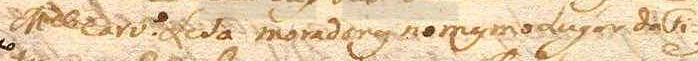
Mel carv.o de sa moradores no mesmo Lugar da Fi
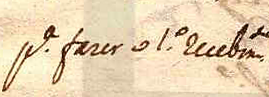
p.a fazer o 1.o Recebim.to
